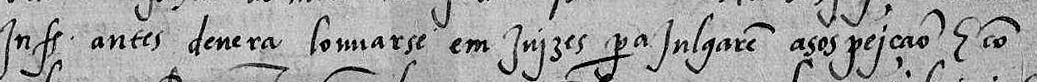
Jnfꝭ. antes deuera louuarse em Jujzes ꝑa Julgarē a sospejçaõ E c̄o
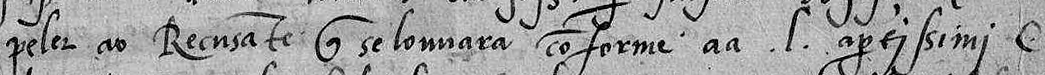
peler ao Recusāte q̄ se louuara c̄oforme aa .l. aꝑtjssimj C.
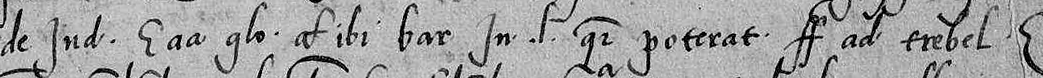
de Jnd. E aa glo. al̄ ibi bar Jn .l. q̄r poterat. ff ad trebel E
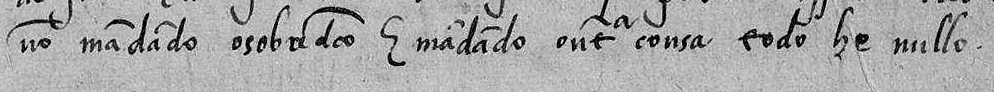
n̄o mādādo o sobred̄co E mādādo outra cousa todo he nullo.
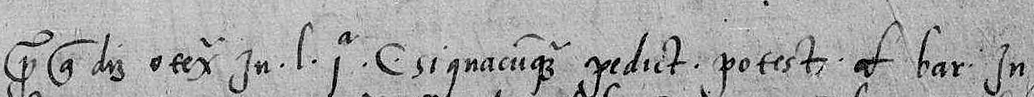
p̄oq̄ diz o tex̄ Jn .l. ja. C. si quacūqꝫ̄ pedict. potest. al̄ bar Jn
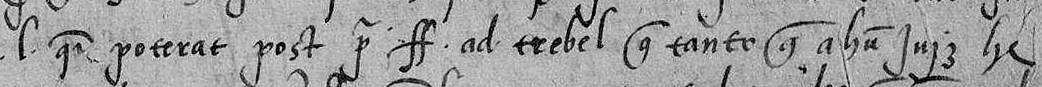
.l. q̄i poterat post p̄ .ff. ad trebel q̄ tanto q̄ a hū Jujz he
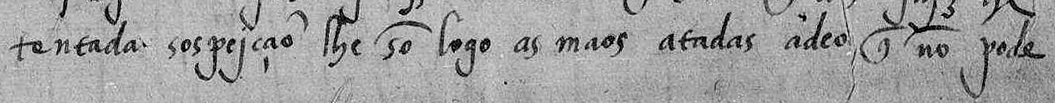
tentada. sospejçaõ lhe s̄o logo as maos atadas adeo q̄ n̄o pode
